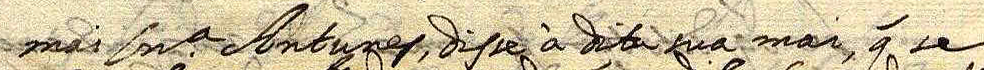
mais Cn.a Antunes, disse à dita sua mai, q̄ se
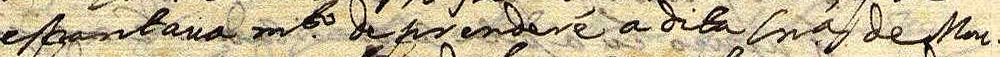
espantaua m.to de prenderē a dita Cn.a de Mou
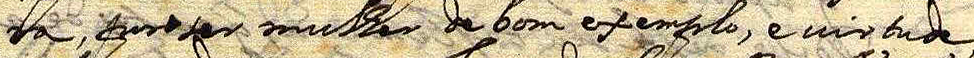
ra, por ser mulher de bom exemplo, e uirtude,
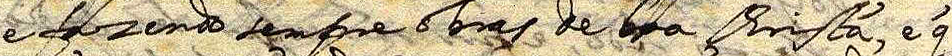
e fazendo sempre obras de boa Christã, e q̄
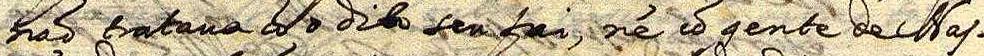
naõ trataua cō o dito seu pai, nē cō gente de Nas
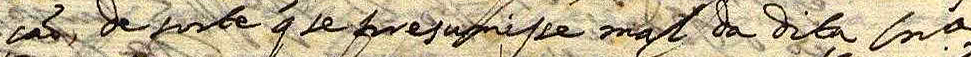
çaõ, de sorte q̄ se presumisse mal da dita Cn.a
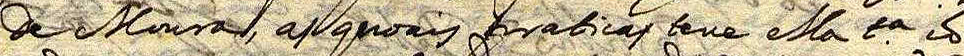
de Moura, as quoais praticas teue ella t.a cō
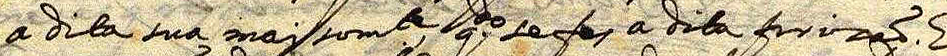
a dita sua mai som.te, q.do se fes a dita prizaõ. E
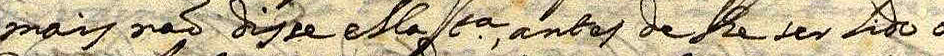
mais naõ disse ella t.a, antes de lhe ser lido o
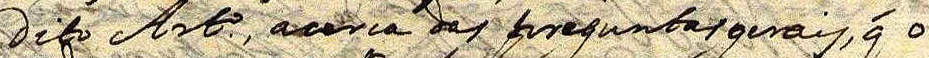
dito Ant.o, acerca das preguntas gerais, q̄ o
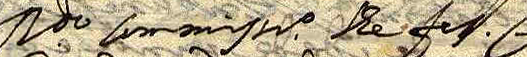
R.do commissr.o lhe fes.
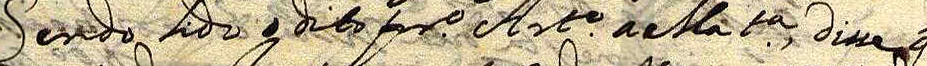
Sendo lido o dito pr.o Art.o a ella t.a, disse q̄
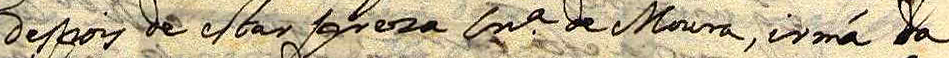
despois de estar preza Cn.a de Moura, irmã da
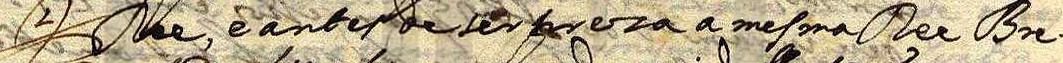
Ree, e antes de ser preza a mesma Ree Bre
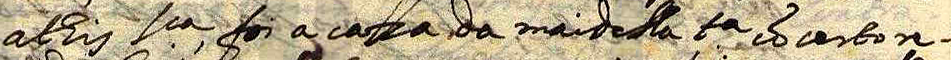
atris L.ca, foi a caza da mai della t.a cō certo re
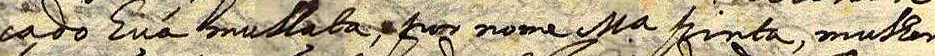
cado huā mullata, por nome M.a pinta, mulher
